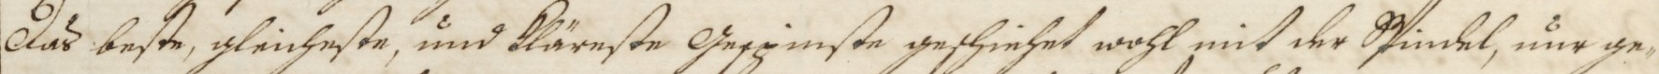Das beste, gleicheste, und kläreste Gespinste geschiehet wohl mit der Spindel, nur ge-
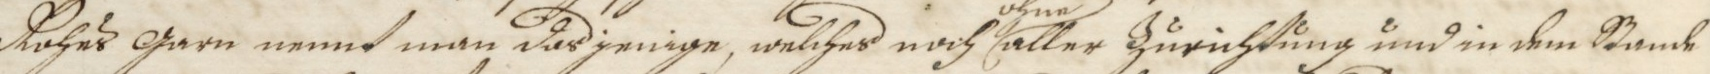Rohes Garn nennt man das jenige, welches noch ohne aller Zurichtung und in dem Stande
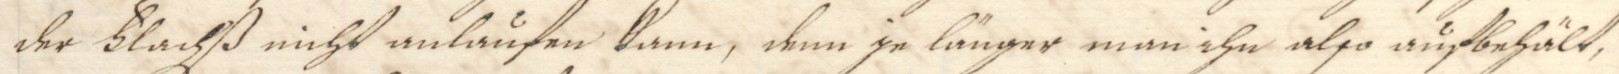der Flachß nicht anlaufen kann, denn je länger man ihn also aufbehält,
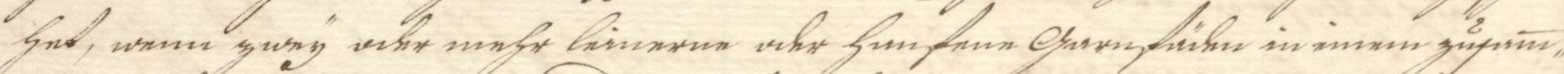het, wenn zwey oder mehr leinerne oder hanfene Garnfäden in einem zusamm-
